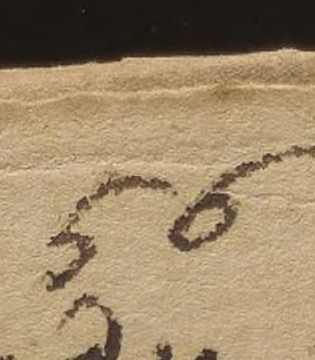56
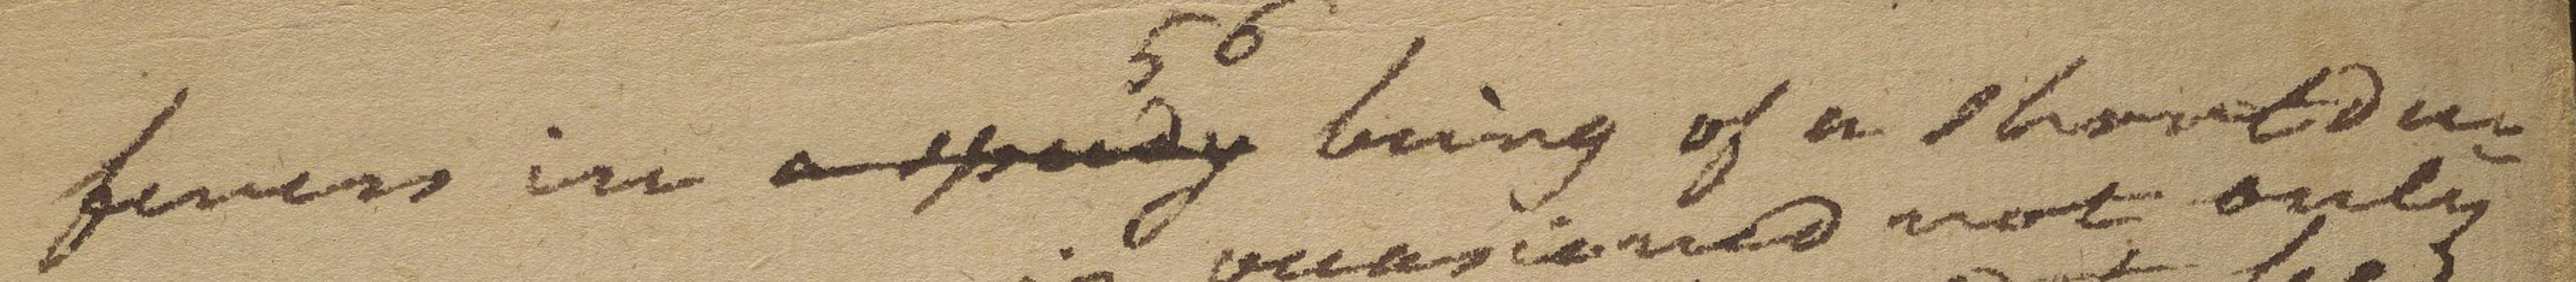fevers in [a speedy] being of a short du-
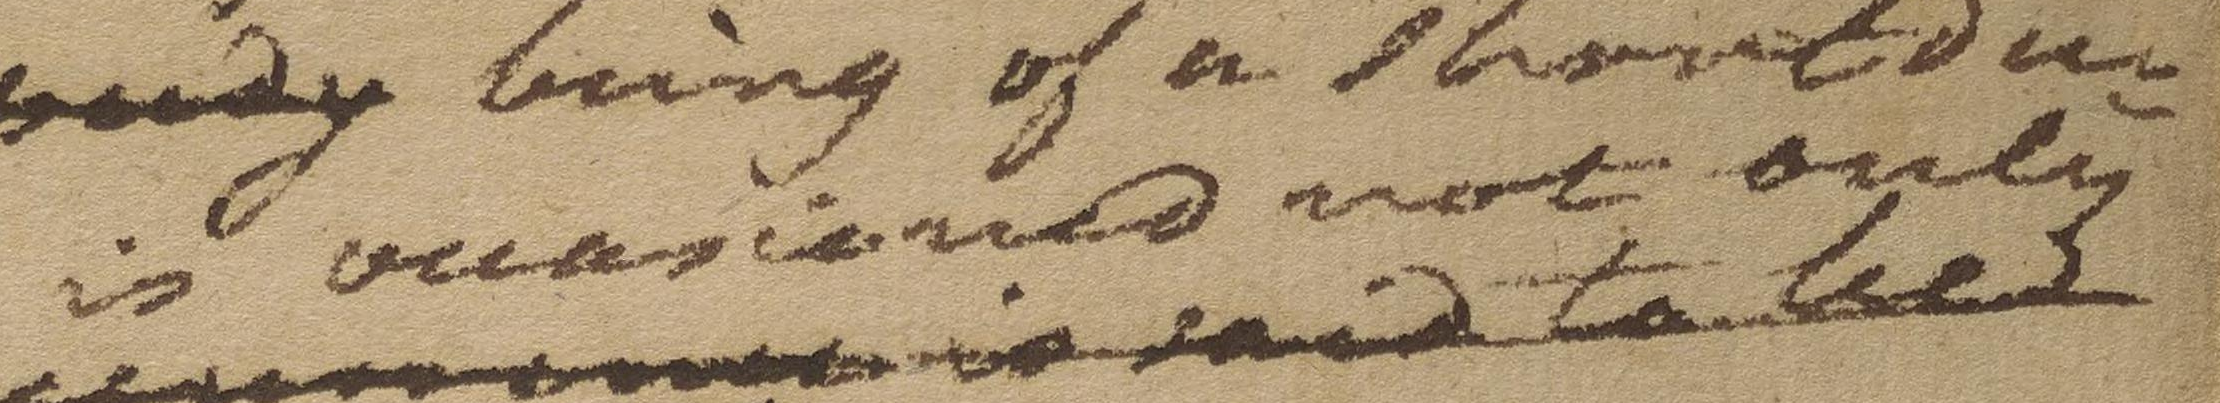is occasioned not only
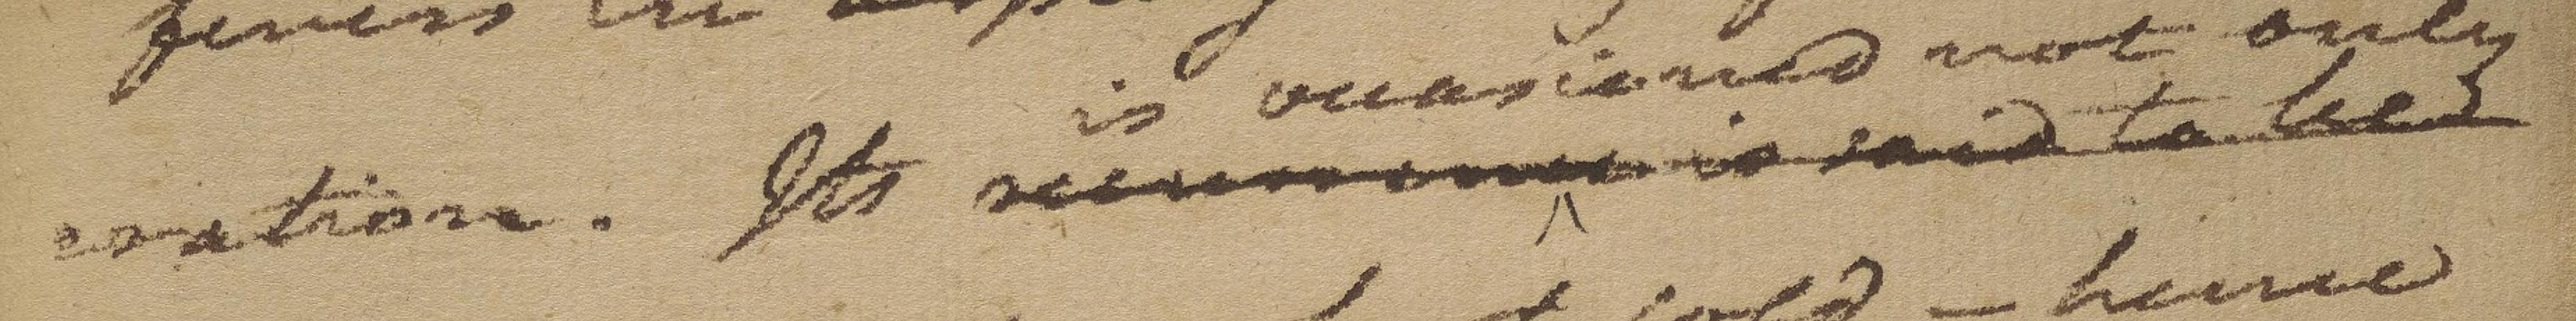-ration. Its ^ [reason is said to be]
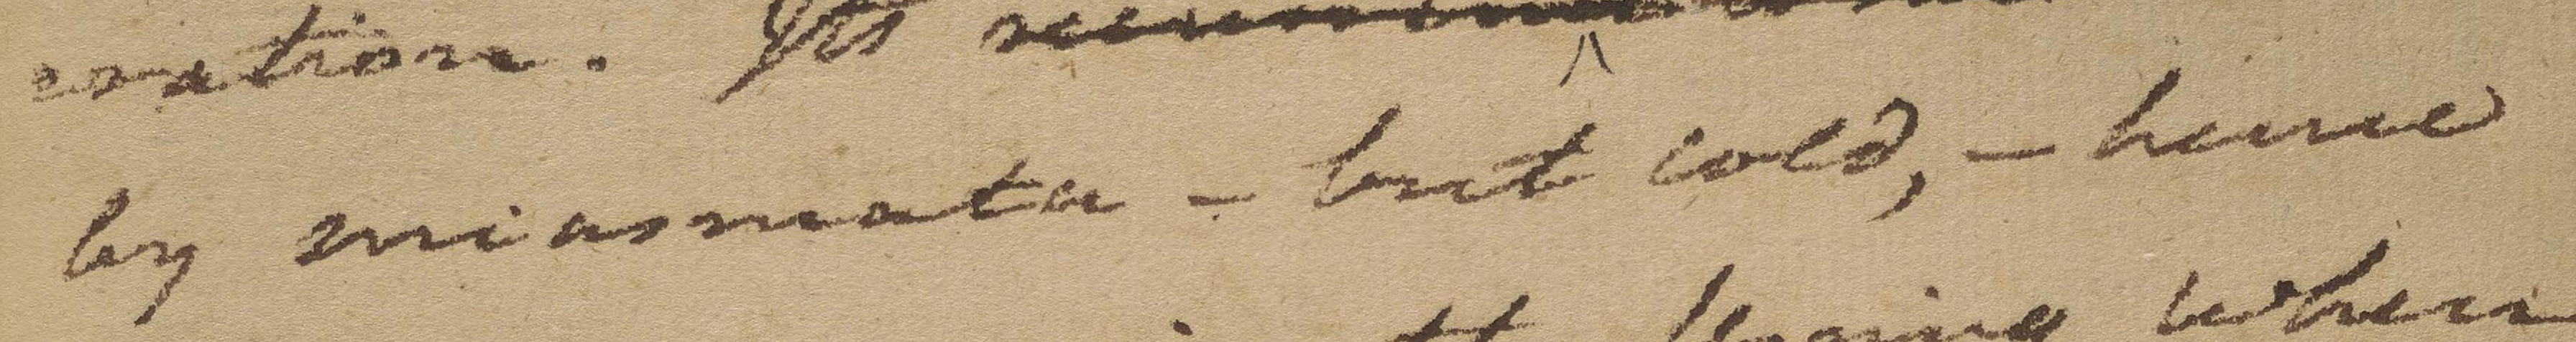by miasmata- but cold,- have
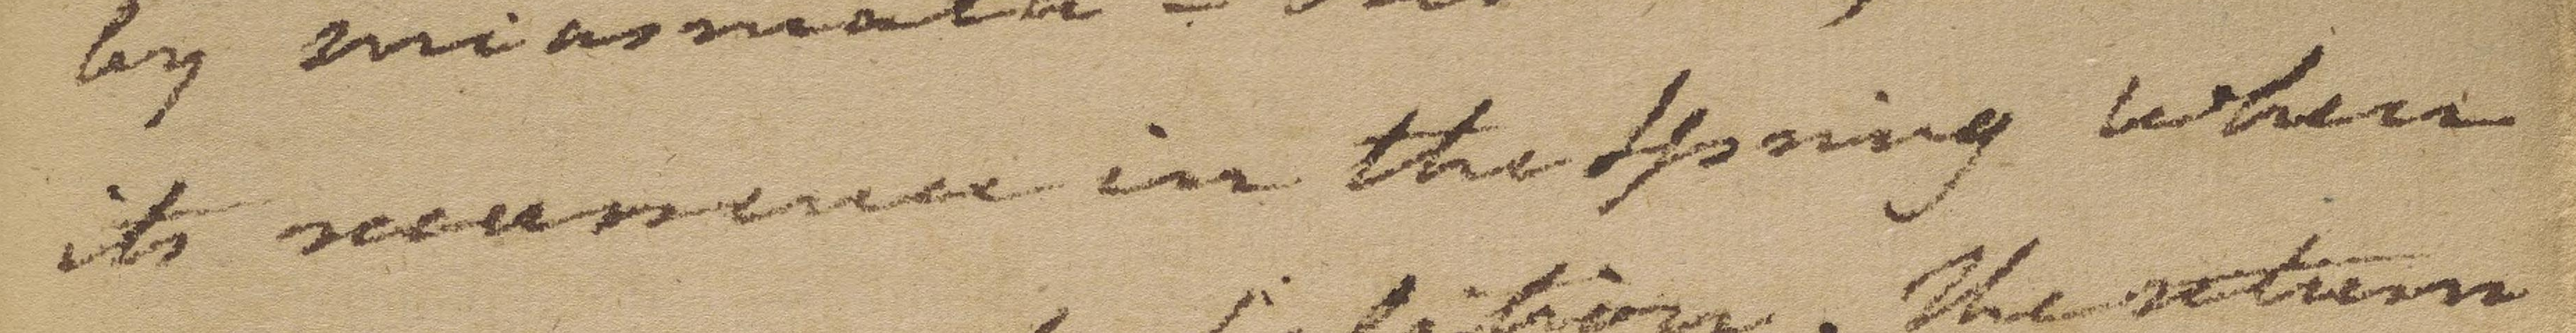it recedes in the spring when
